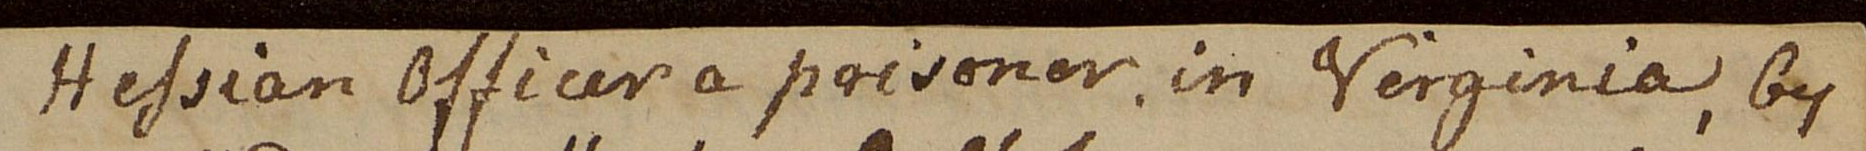Hessian Officer a prisoner in Virginia, by
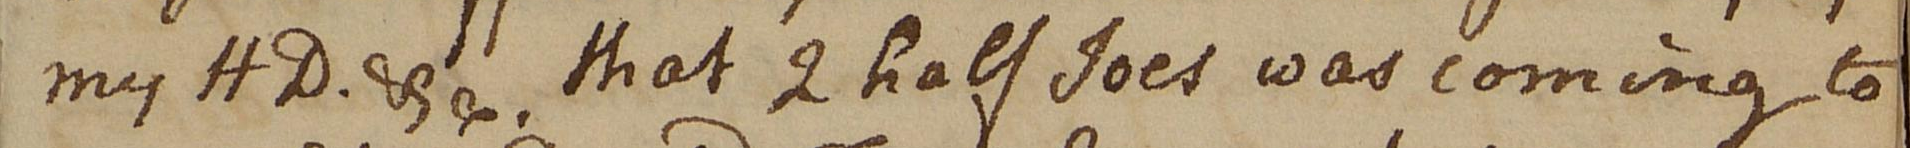my HD. &c, that 2 half Joes was coming to
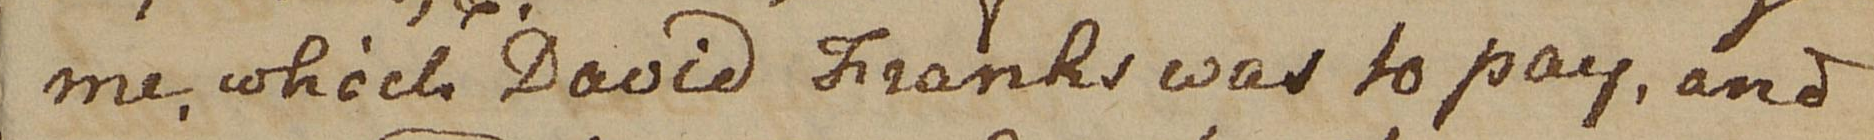me, which David Franks was to pay, and
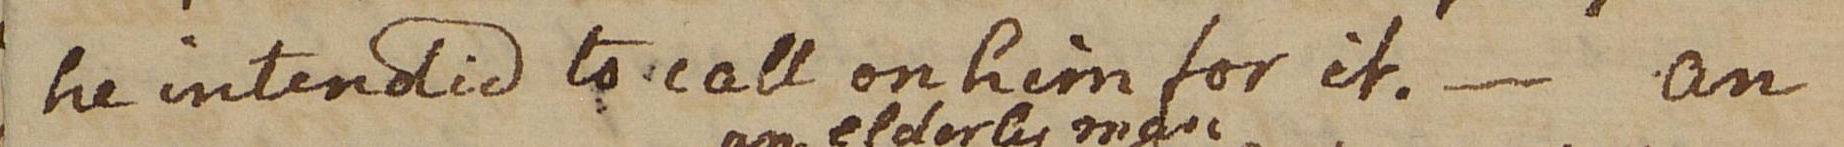he intendid to call on him for it.- an
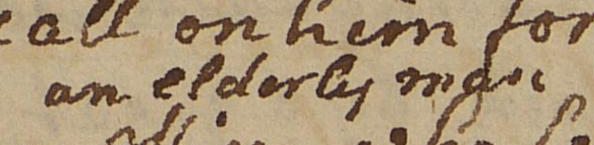an elderly man
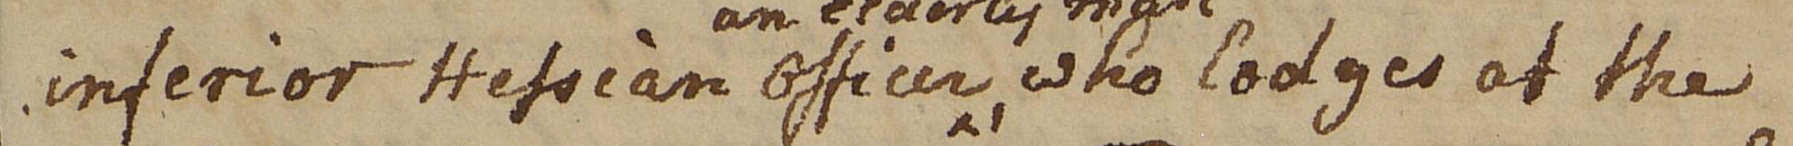inferior Hessian Officer ^ , who lodges at the
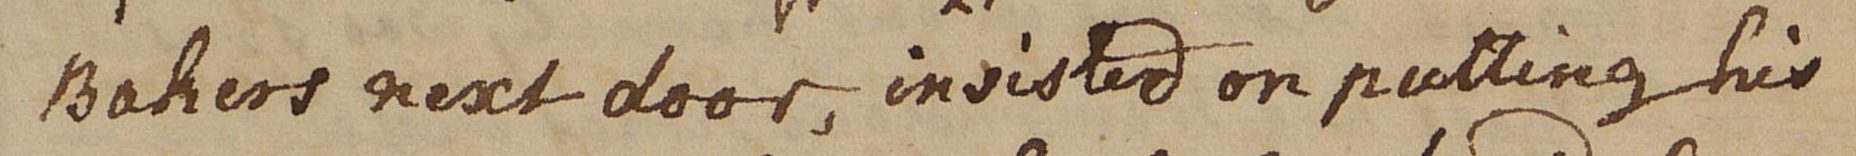Bakers next door, insisted on putting his
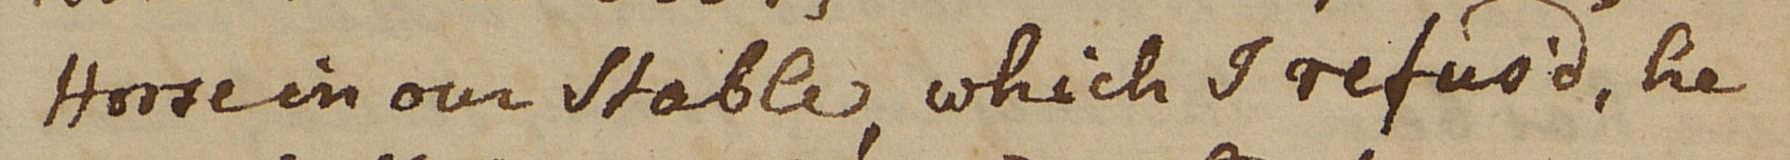Horse in our Stables, which I refus'd, he
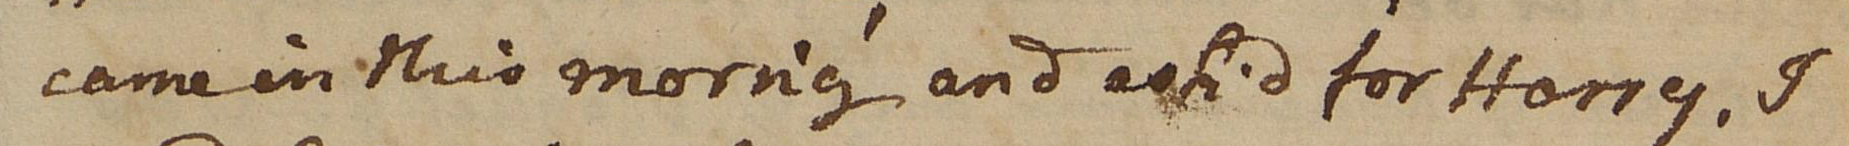came in this morn'g and ask'd for Harry, I
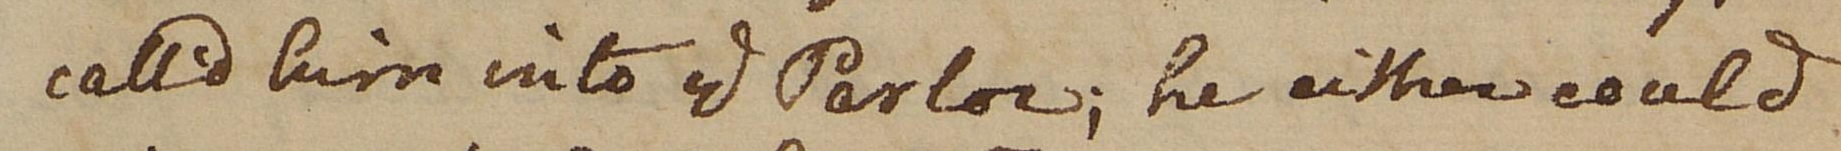call'd him into y^e Parlor; he either could
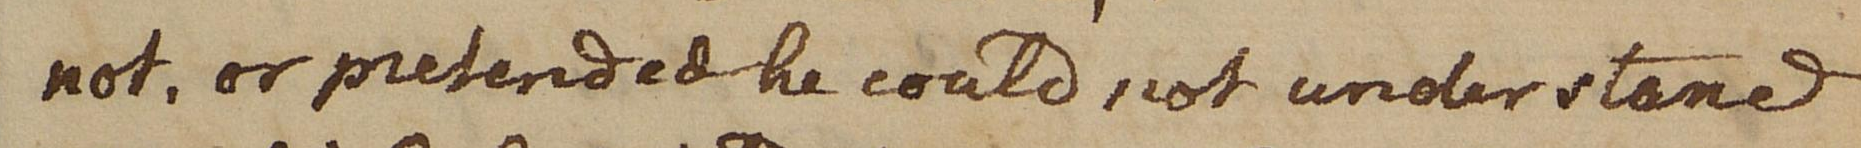not, or pretended he could not understand
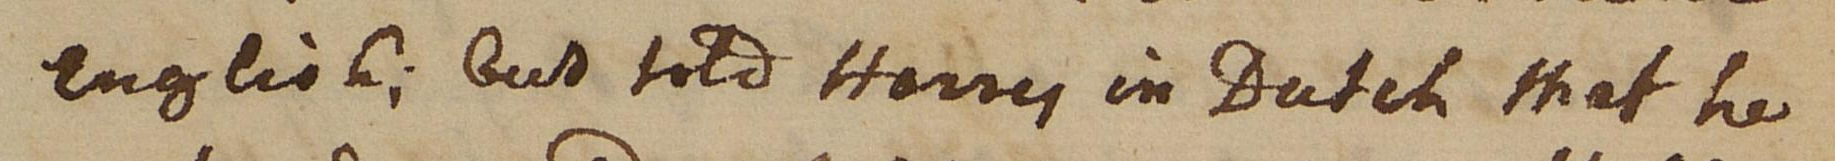English; but told Harry in Dutch that he
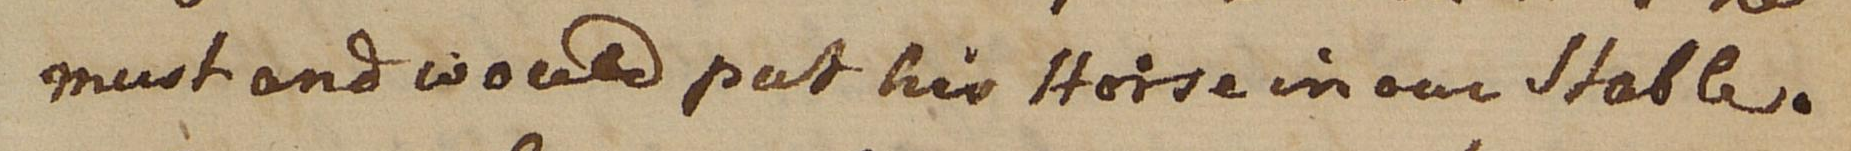must and would put his Horse in our Stable.
